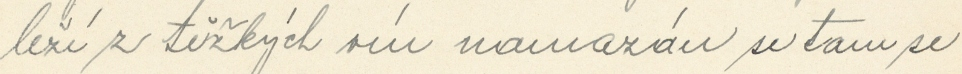leží z těžkých vín namazán se tam se
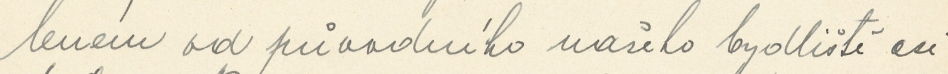leném od původního našeho bydliště asi
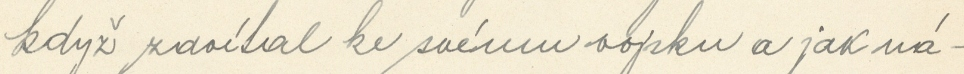když zavítal ke svému vojsku a jak ná-
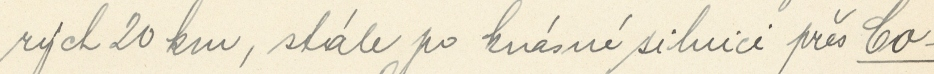rých 20 km, stále po krásné silnici přes Co-
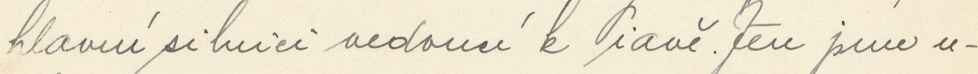hlavní silnici vedoucí k Piavě. Jen jsme u-
